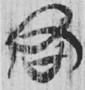君君
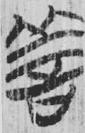善
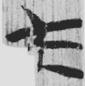大大
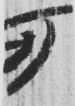可（何）
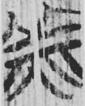羕（用）
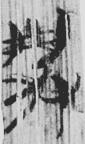○（爭）
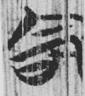命（令）
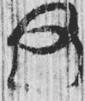尹
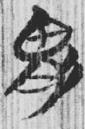{胃刀}（謂）
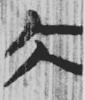大（太）
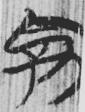○（宰）
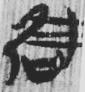唯
